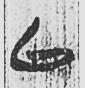㠯（以）
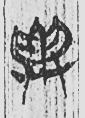與
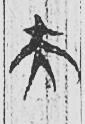夫
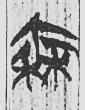秦
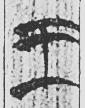王
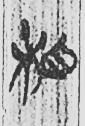相
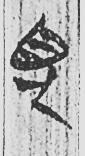見
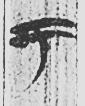于
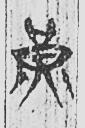黃
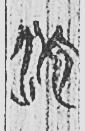池
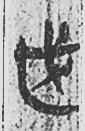戉
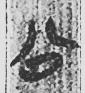公
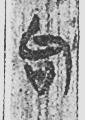勾
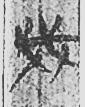戔
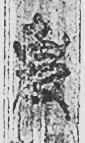尅
